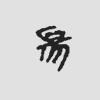昜
